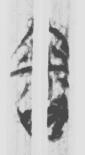審
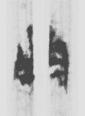甬
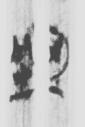型
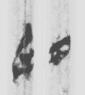㠯（以）
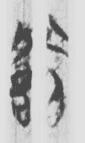罰
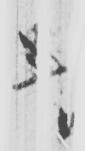之
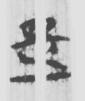是
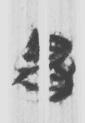胃
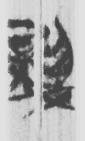{則戈}
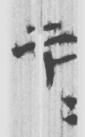下=
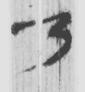乃
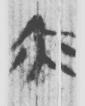亦
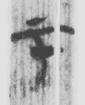丂
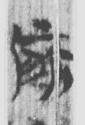所
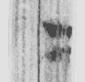二
